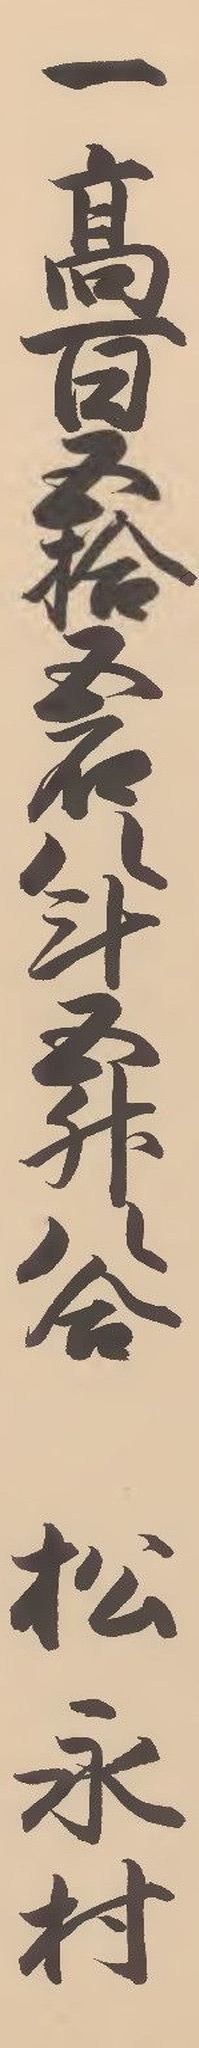一高百五拾五石八斗五升八合松永村
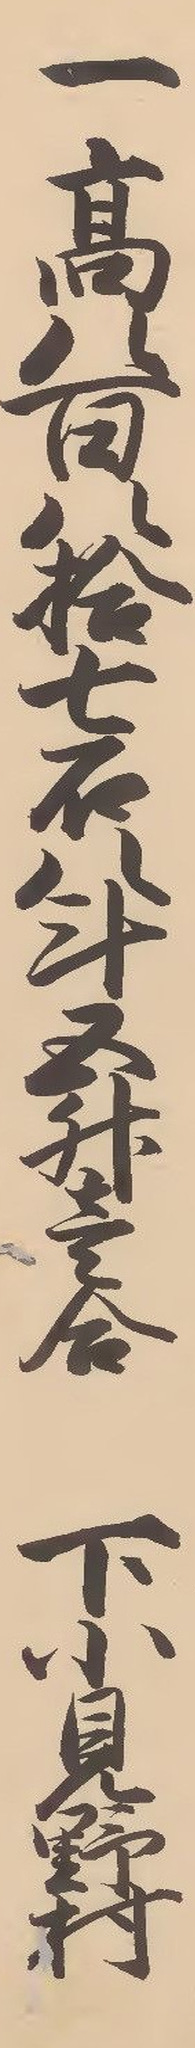一高八百八拾七石八斗五升壱合下小見野村

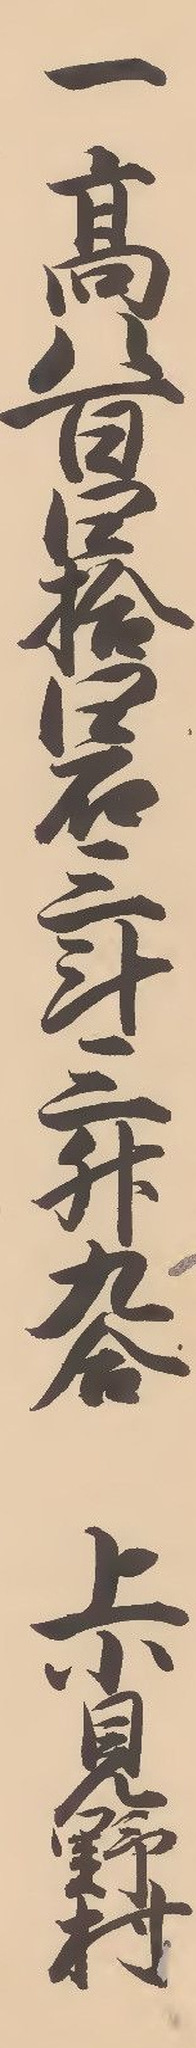一高八百四拾四石三斗三升九合上小見野村
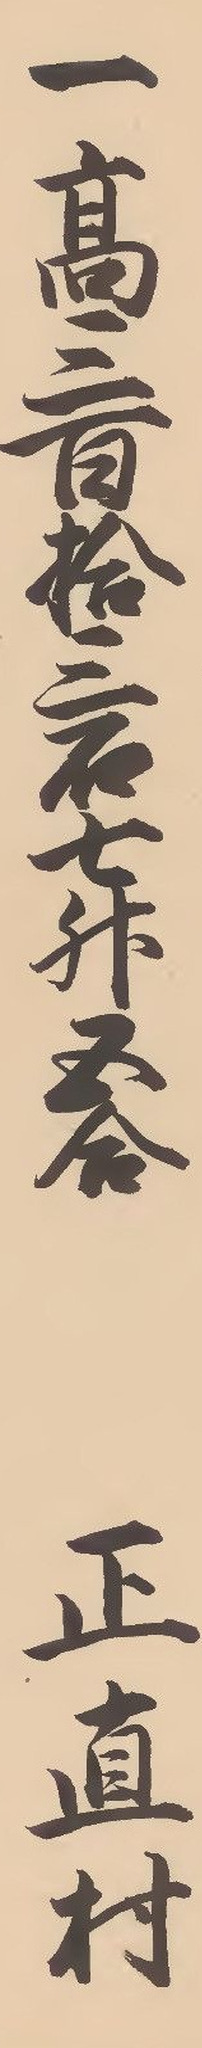一高三百拾三石七升五合正直村
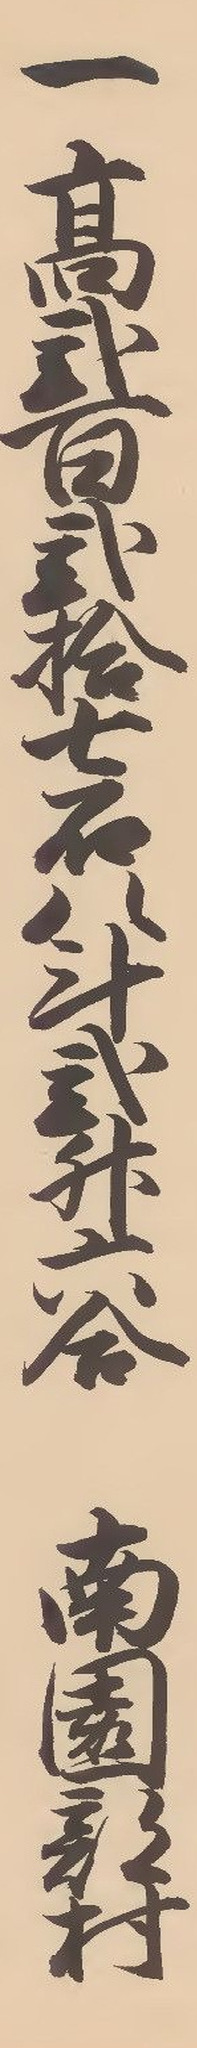一高弐百弐拾七石八斗弐升六合南園部村
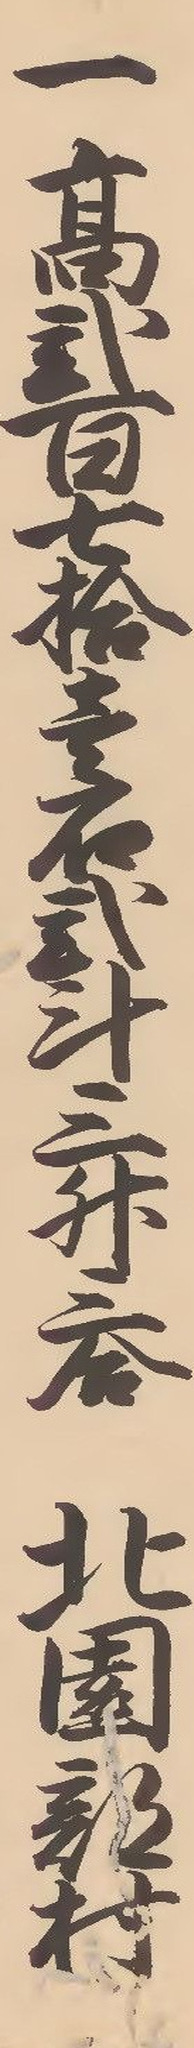一高弐百七拾壱石弐斗三升三合北園部村
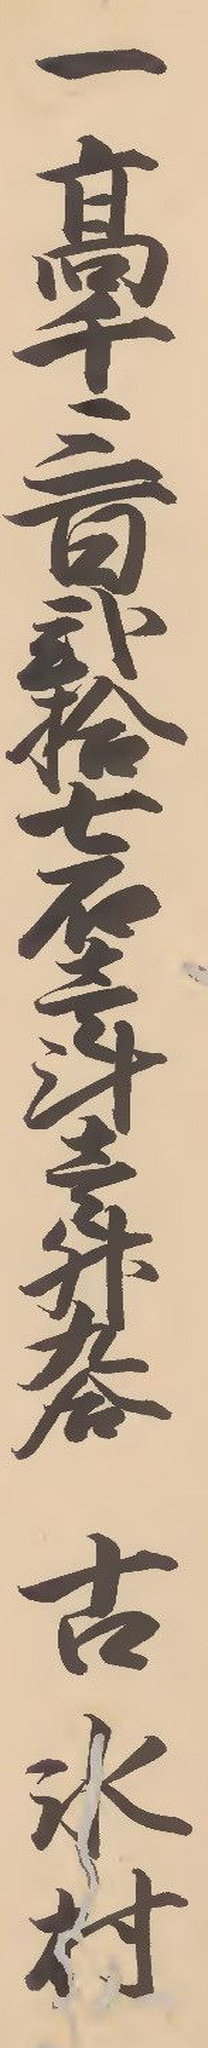一高千三百弐拾七石壱斗壱升九合古氷村
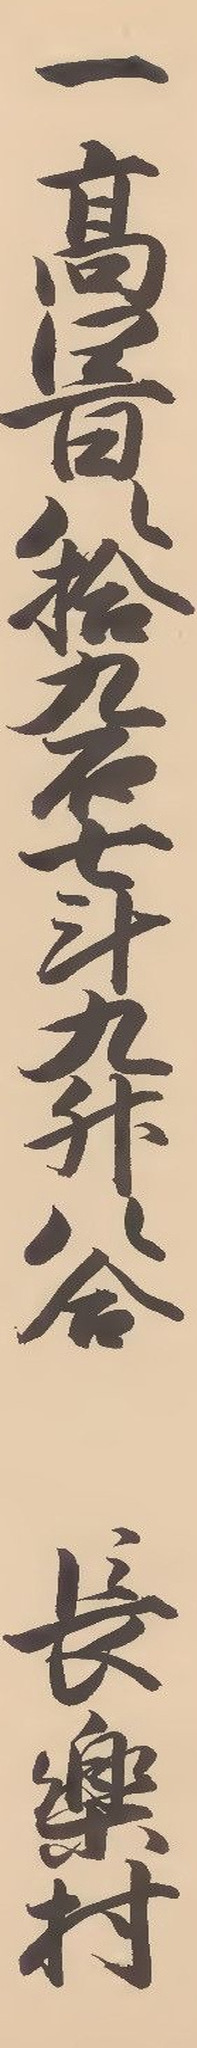一高四百八拾九石七斗九升八合長楽村
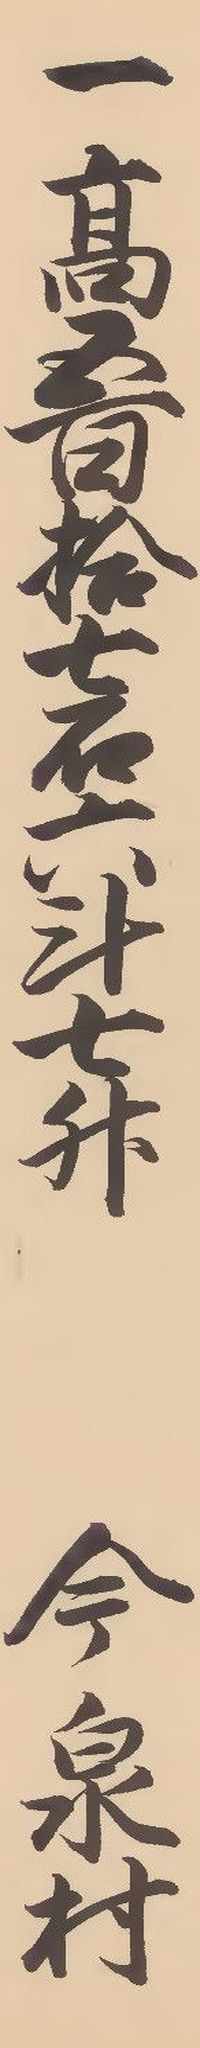一高五百拾七石六斗七升今泉村
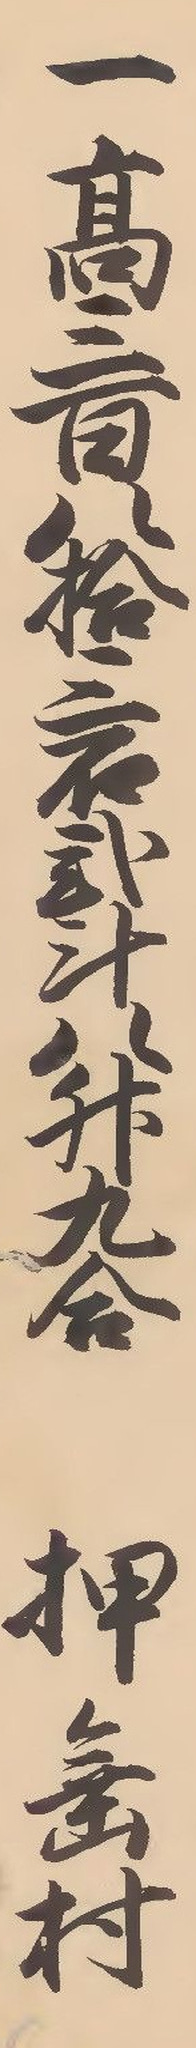一高三百八拾三石弐斗八升九合押垂村

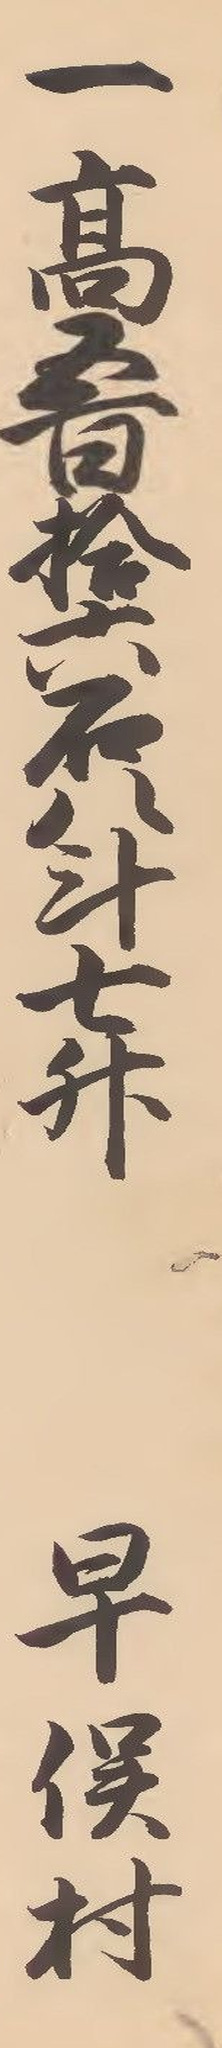一高五百拾六石八斗七升早俣村
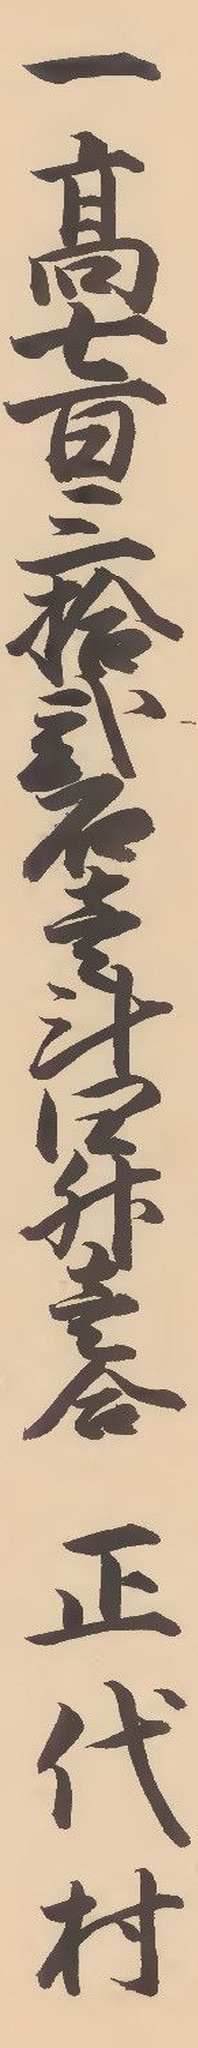一高七百三拾弐石壱斗四升壱合正代村
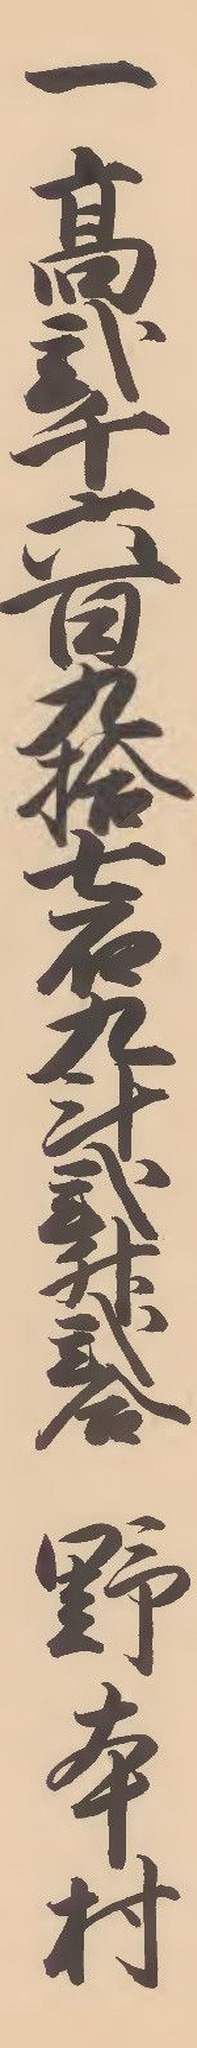一高弐千六百九拾七石九斗弐升弐合野本村
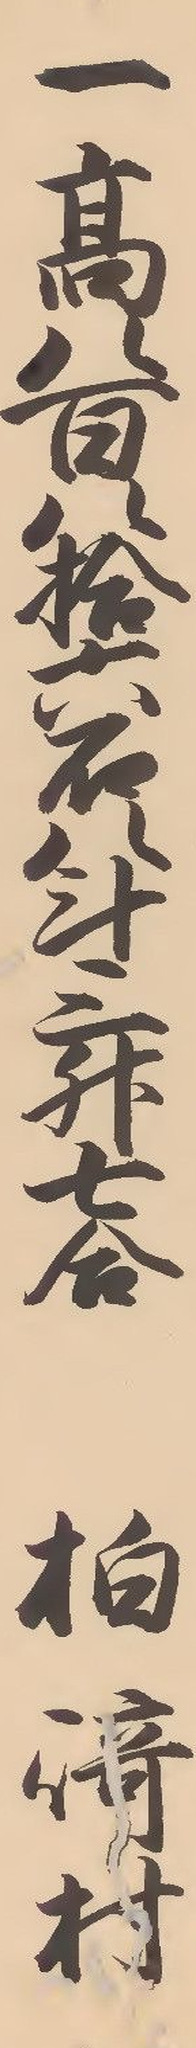一高八百八拾六石八斗三升七合柏崎村
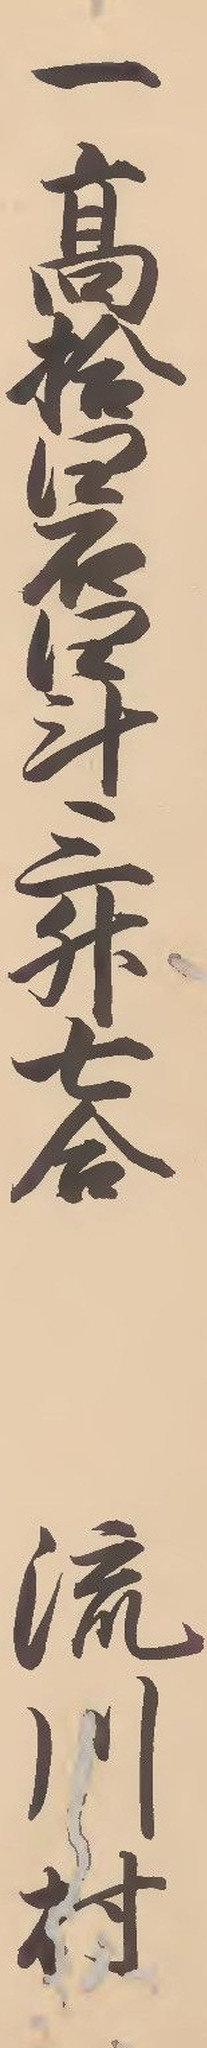一高拾四石四斗三升七合流川村
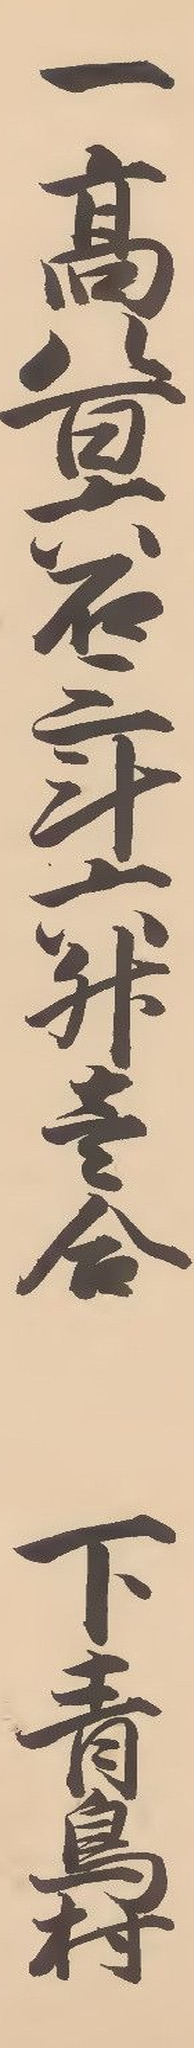一高八百六石三斗六升壱合下青鳥村
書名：武蔵国郷帳　下
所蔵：国立公文書館 National Archives of Japan
